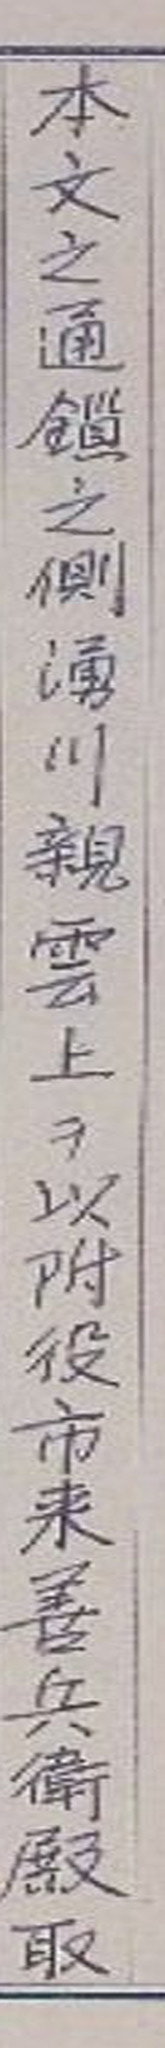本文之通鎖之側湧川親雲上を以附役市来善兵衛殿取
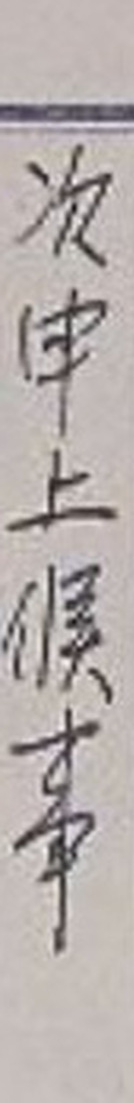次申上候事
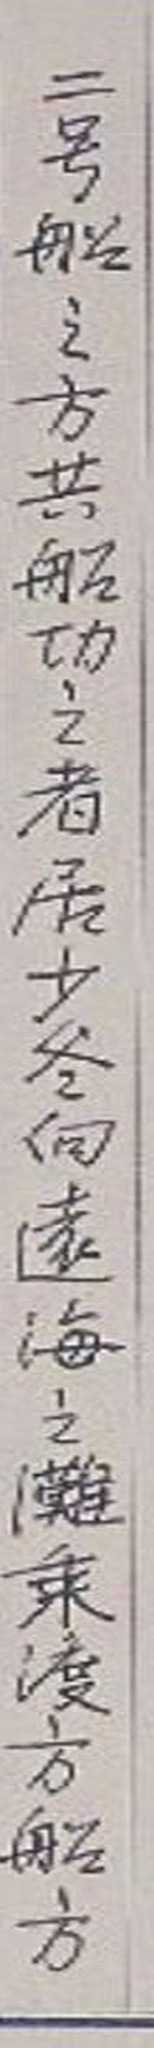二号船之方共船功之者居少冬向遠海之灘乗渡方船方
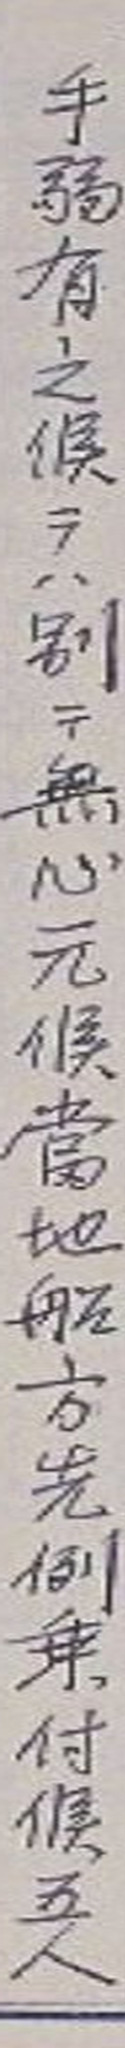手弱有之候ては別て無心元候当地船方先例乗付候五人
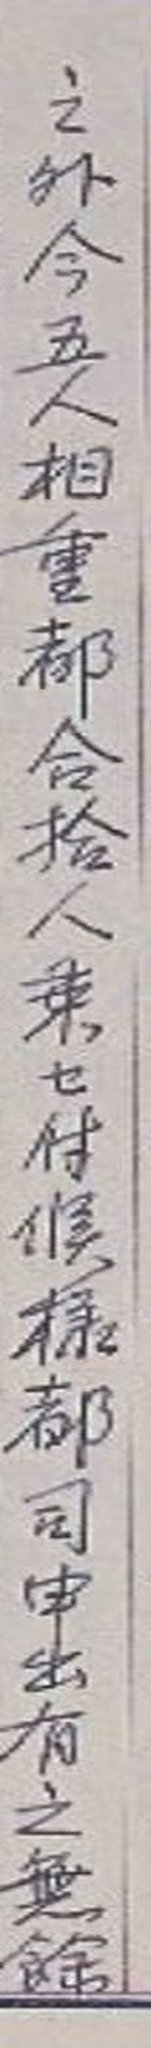之外今五人相重都合拾人乗せ付候様都司申出有之無余
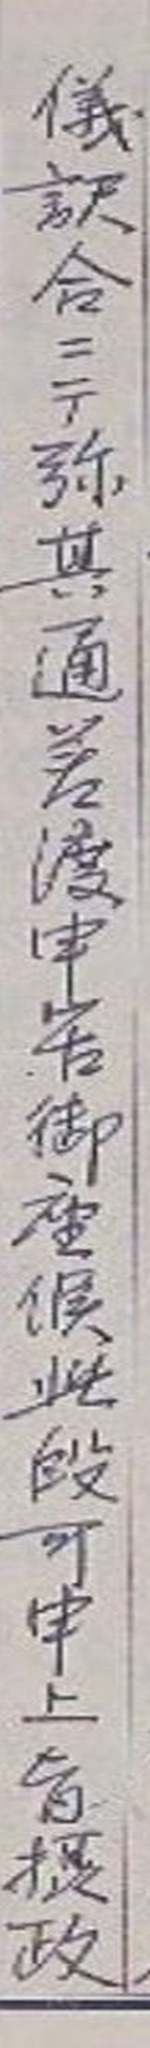儀訳合にて弥其通差渡申筈御座候此段可申上旨摂政
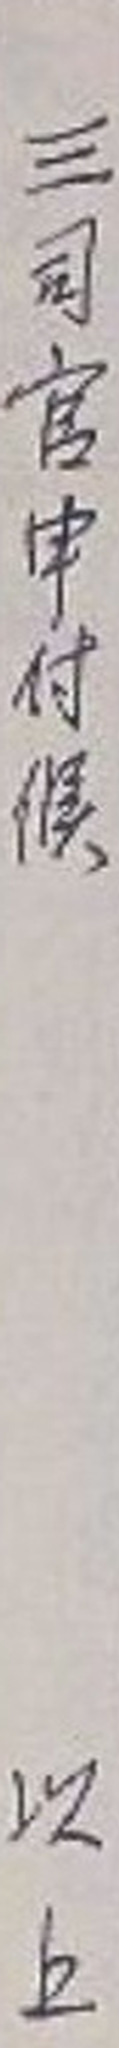三司官申付候以上
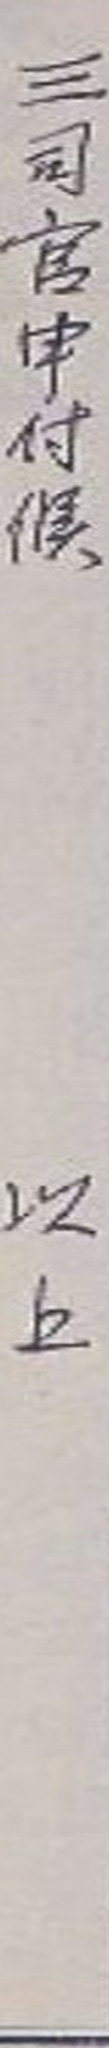三司官申付候以上
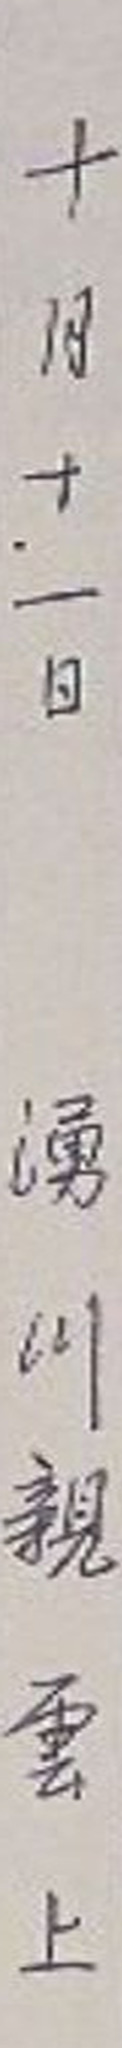十月十一日湧川親雲上
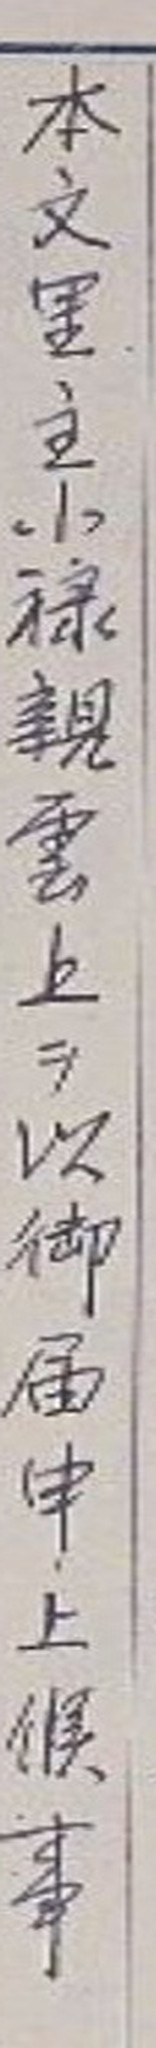本文里主小禄親雲上を以御届申上候事
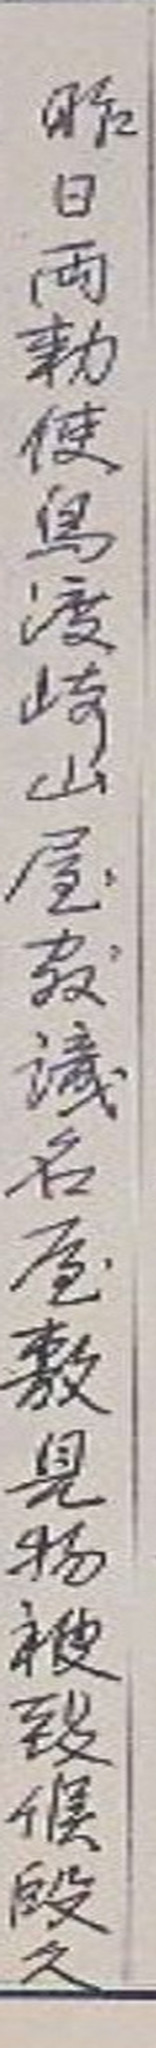昨日両勅使鳥渡崎山屋敷識名屋敷見物被致候段久
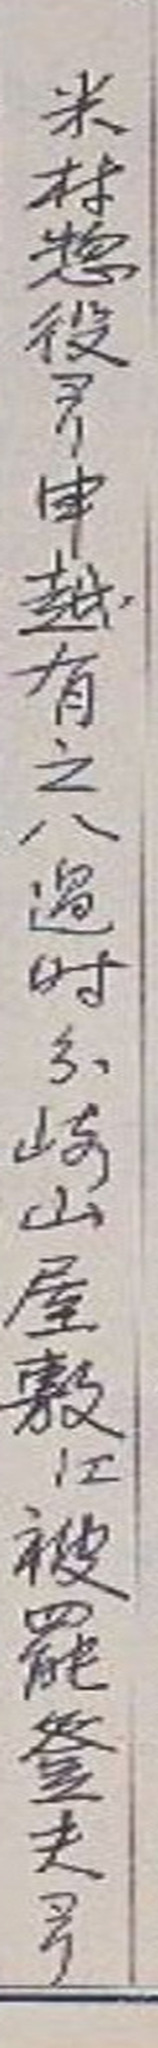米村惣役より申越有之八過時分崎山屋敷え被罷登夫より
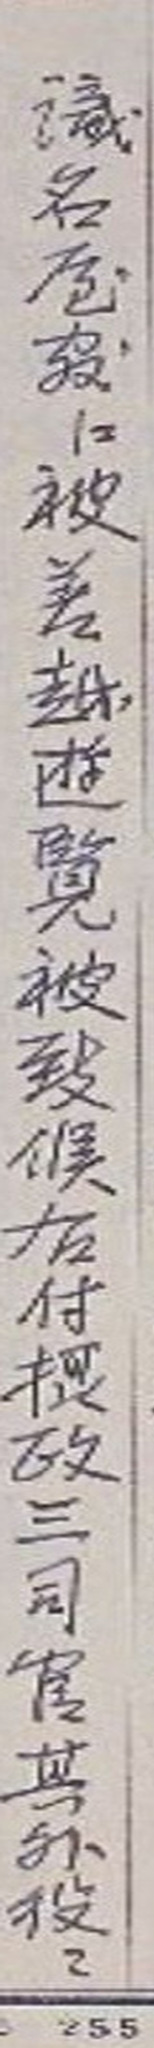敷識名屋敷え被差越遊覧被致候右付摂政三司官其外役々
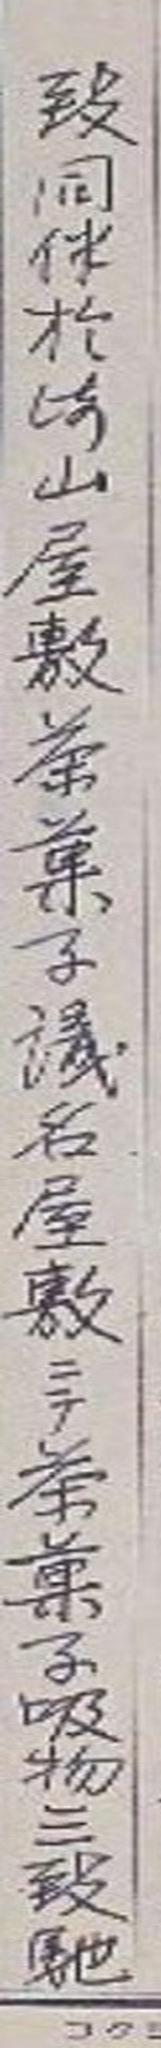致同伴於崎山屋敷茶菓子敷識名屋敷にて茶菓子吸物三致馳
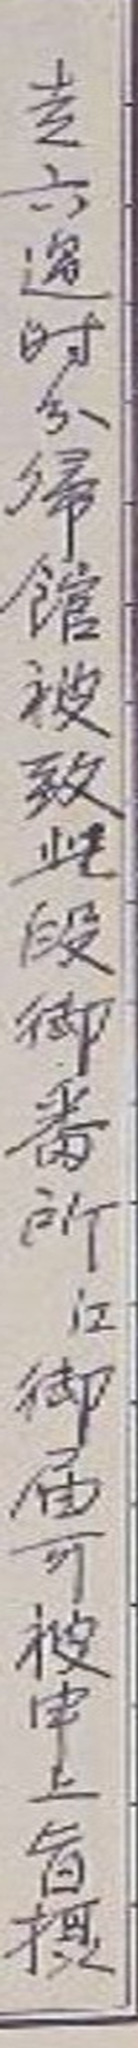走六過時分帰館被致此段御番所え御届可被申上旨摂
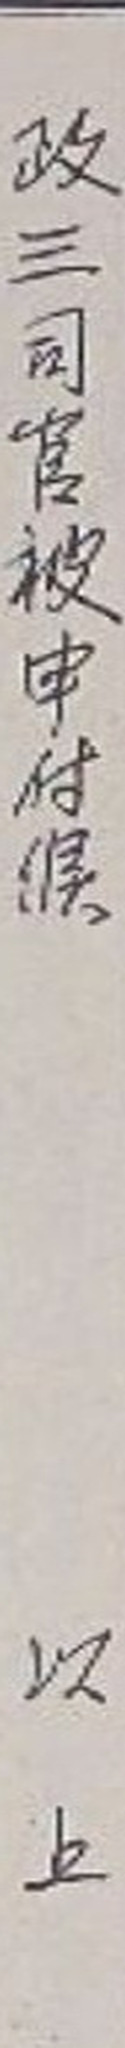政三司官被申付候以上
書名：支那冊封使来琉諸記 下巻
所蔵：University of the Ryukyus Library
